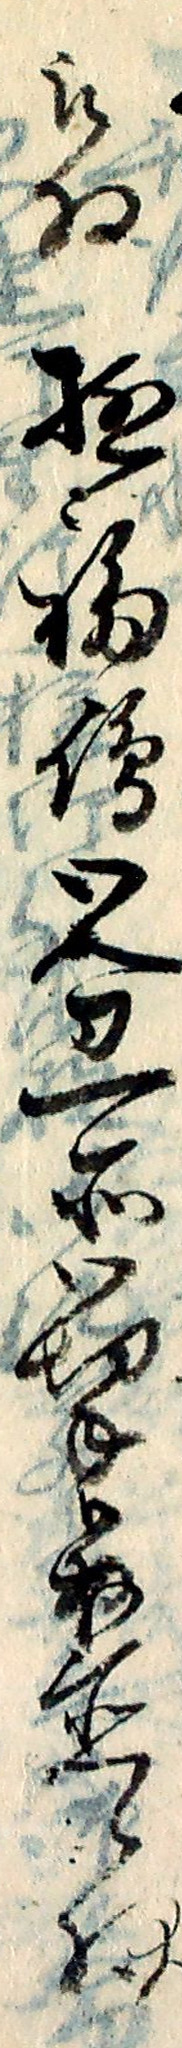被為遊福島御分一所御切手被出置候様
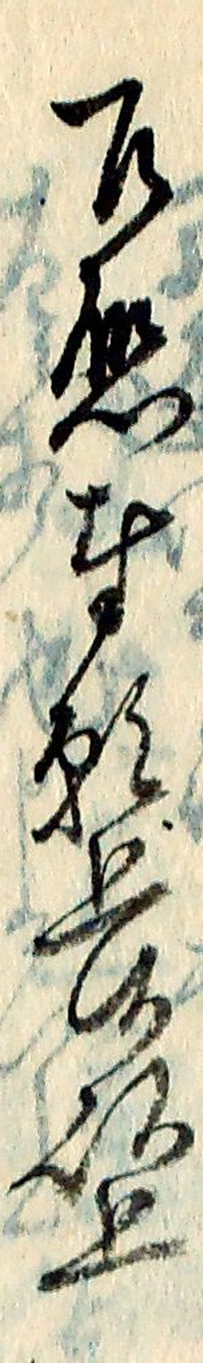乍恐奉願上候以上
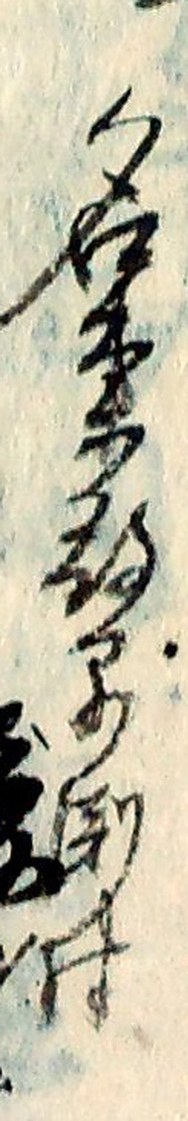名東郡早淵村
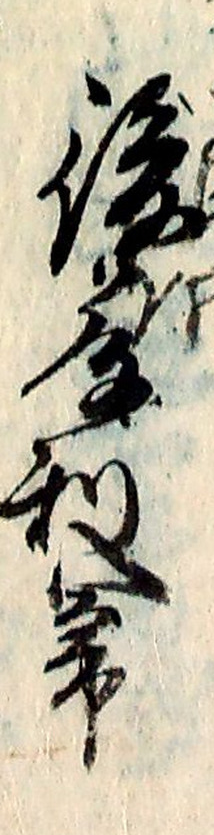後藤利八郎
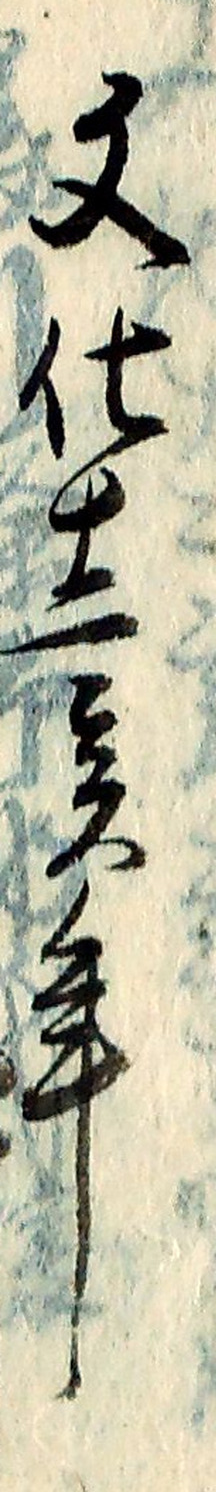文化十二亥年
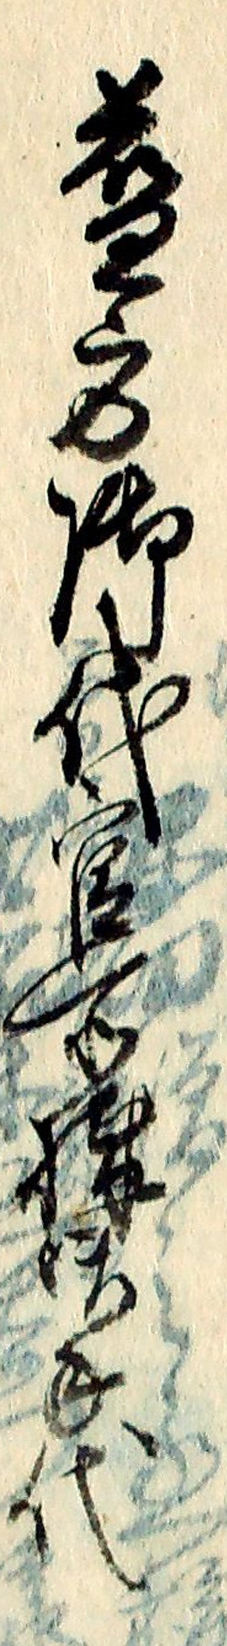藍方御代官所様御手代
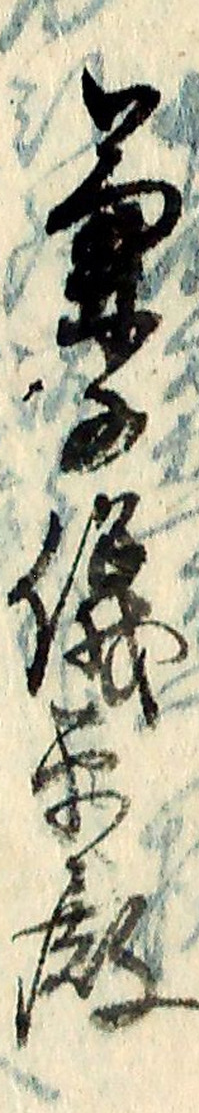兼子儀平殿
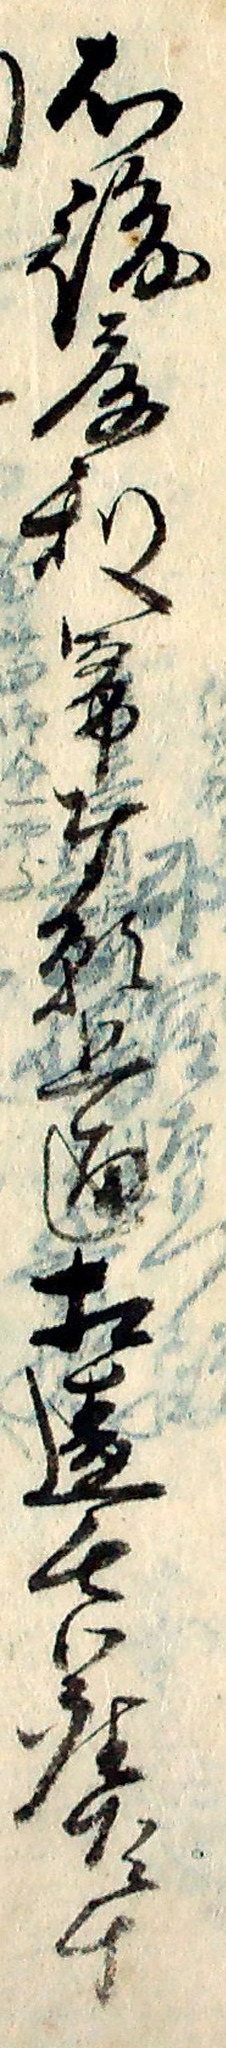右後藤利八郎奉願上通相違無御座候に付
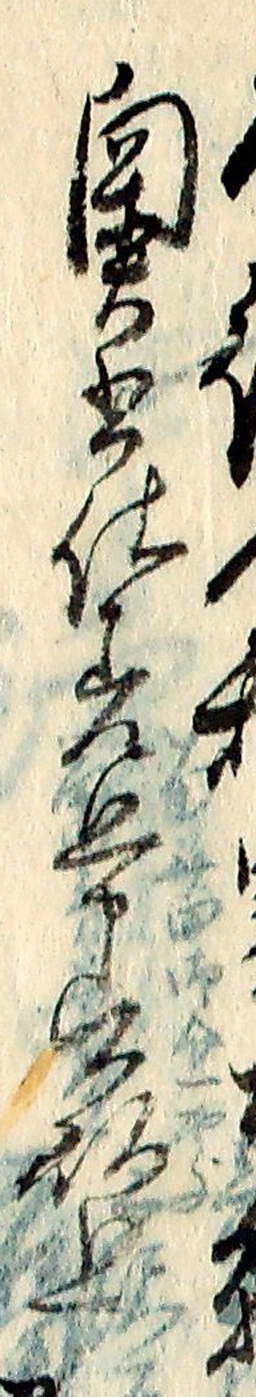奥書仕差上申候以上
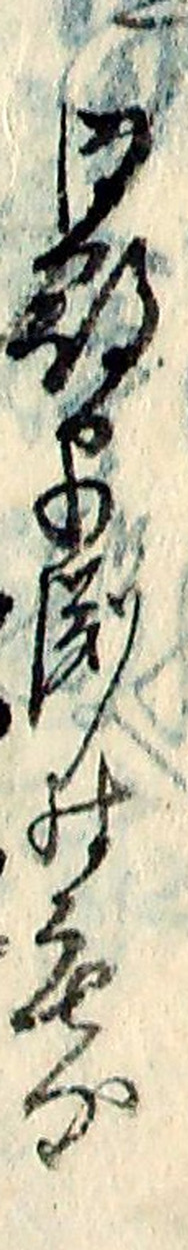同郡早淵村庄屋
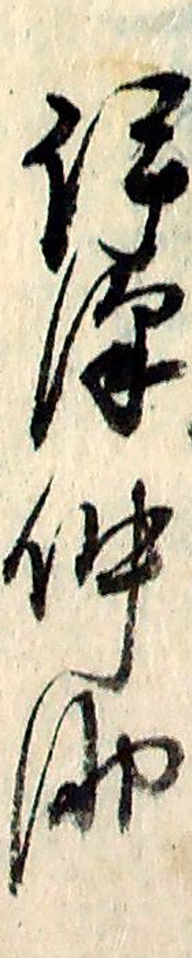伊沢仲助
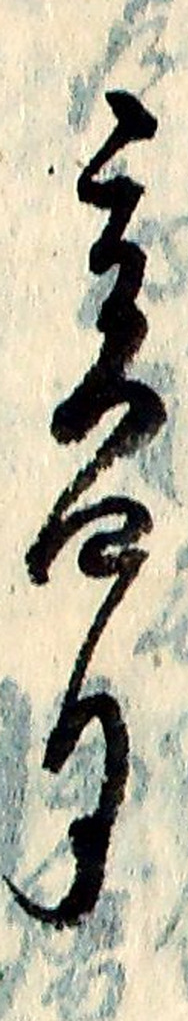亥四月
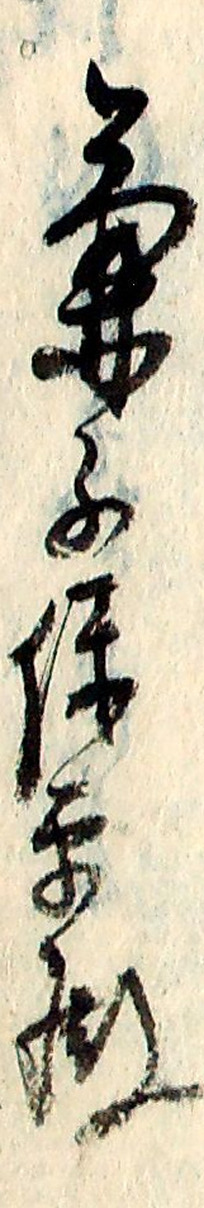兼子儀平殿

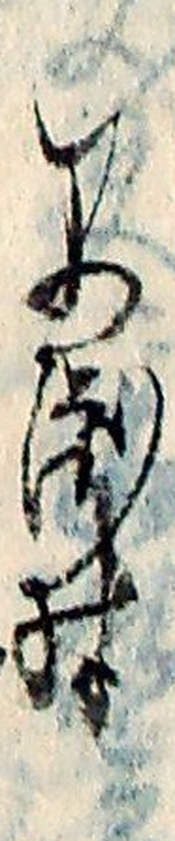早淵村
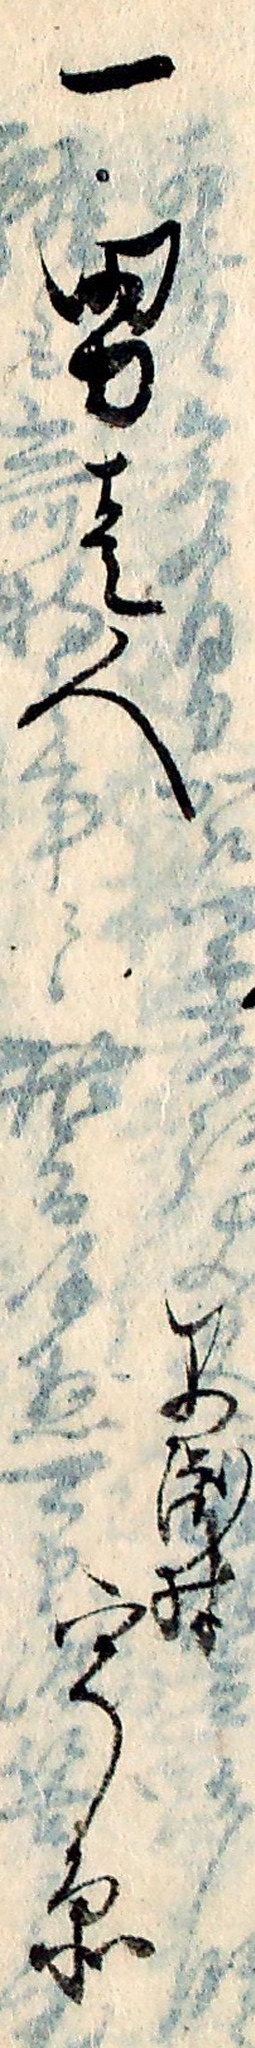一男壱人宇兵衛
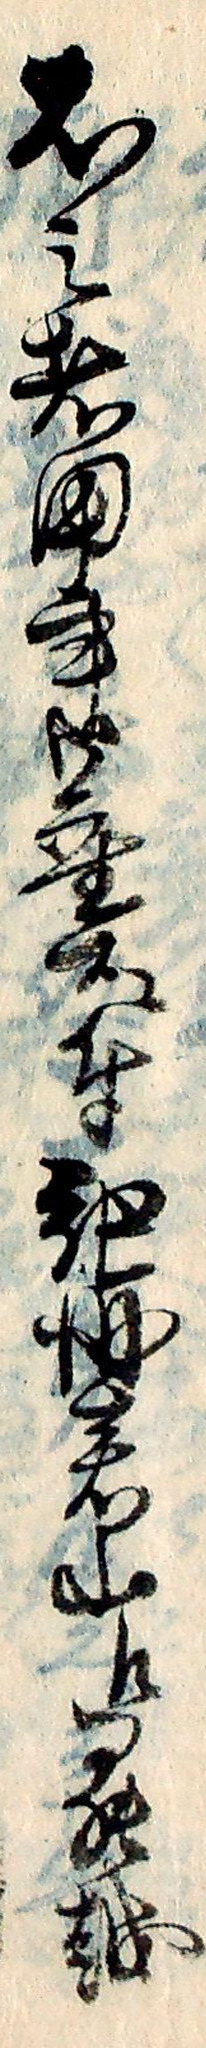右之者用事御座候に付紀州若山え罷越
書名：諸御願書控(後藤氏壱番）
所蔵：鳴門教育大学 Naruto University of Education
